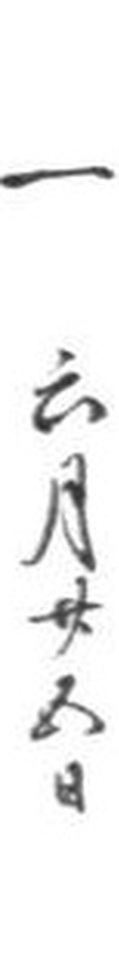一六月廿五日
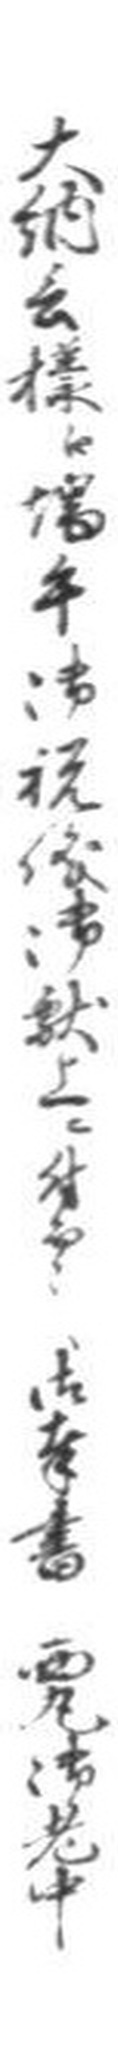大納言様江端午御祝儀御献上ニ付而之御奉書西丸御老中
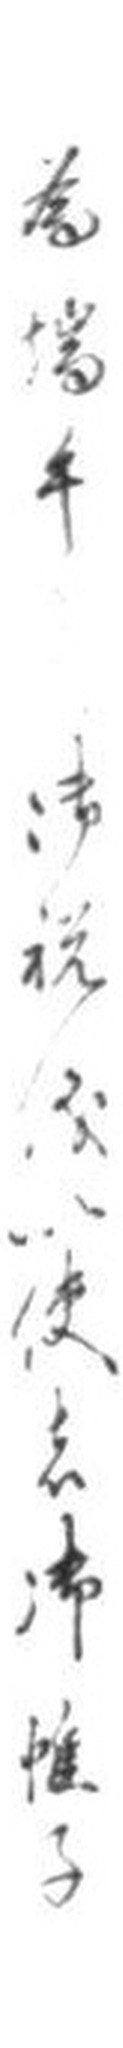為端午御祝儀以使者御帷子
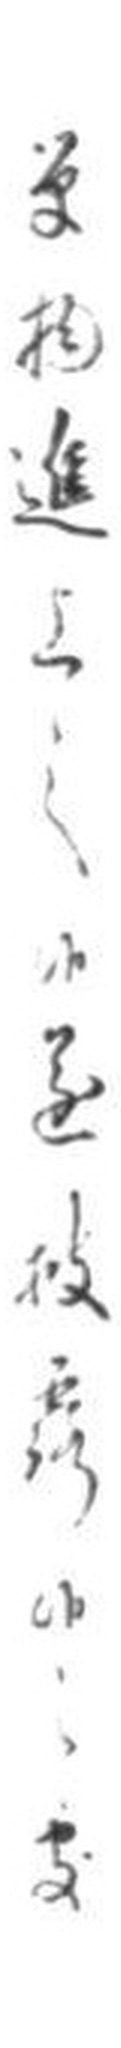単物進上之候遂披露候之処
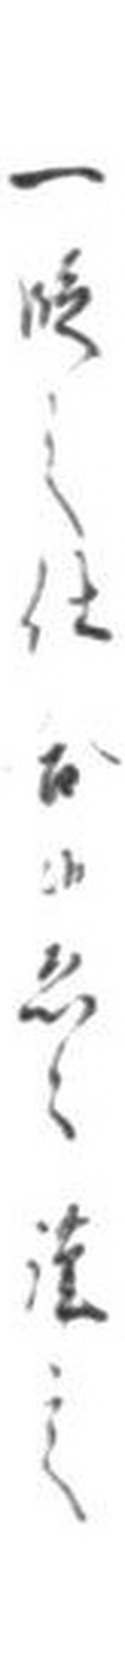一段之仕合候恐々謹言
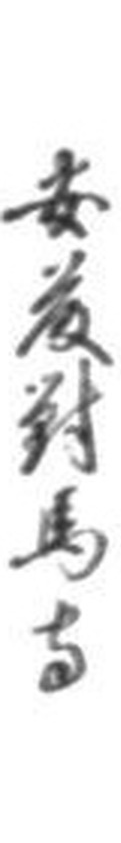安藤対馬守
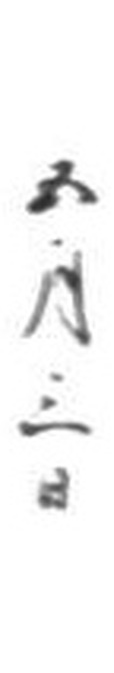五月三日
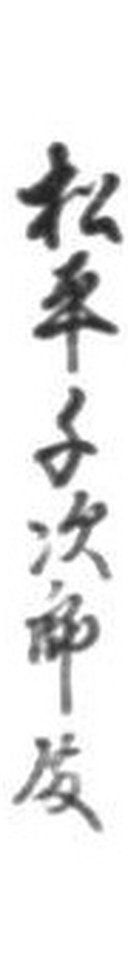松平千次郎殿
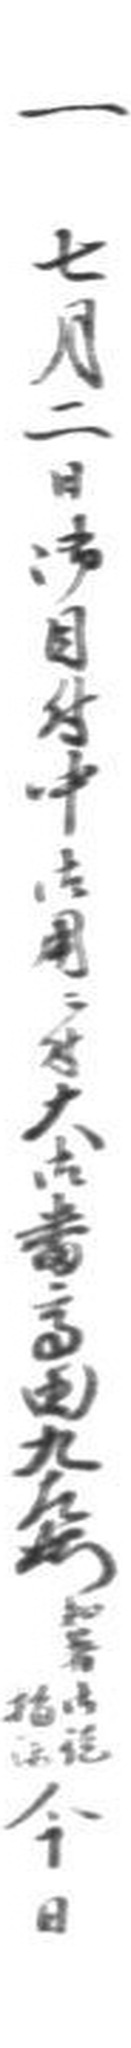一七月二日御目付中御用ニ付大御番高田九左衛門知著御徒指添今日
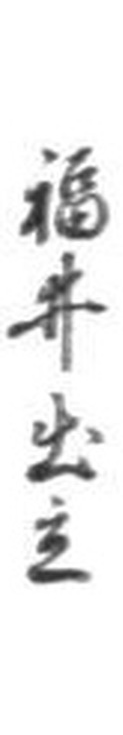福井出立
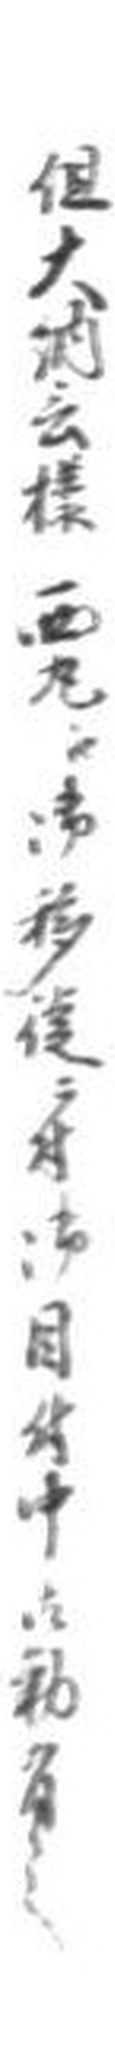但大納言様西丸江御移徙ニ付御目付中御勤有之
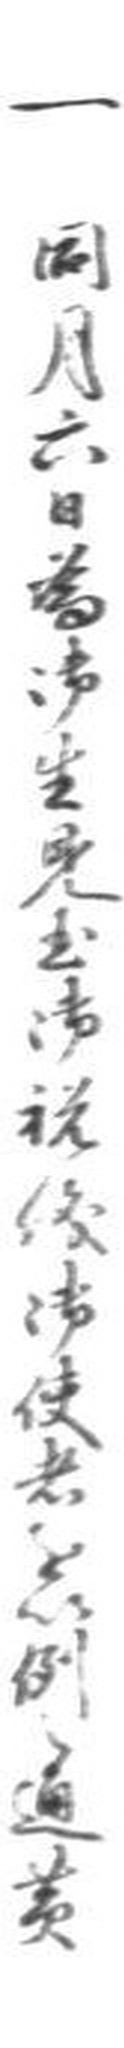一同月六日為御生見玉御祝儀御使者を以例之通黄

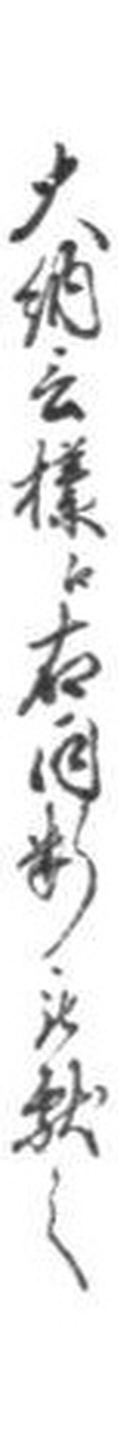大納言様江右同断被献之
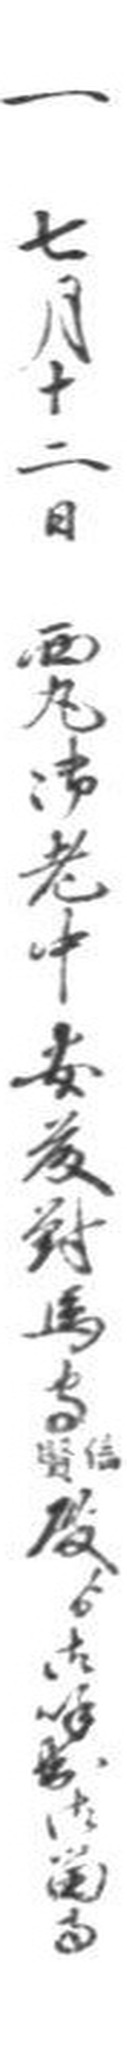一七月十二日西丸御老中安藤対馬守信賢殿ゟ御呼出御留守
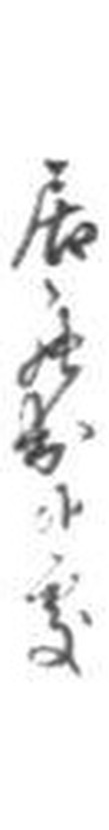居罷出候処
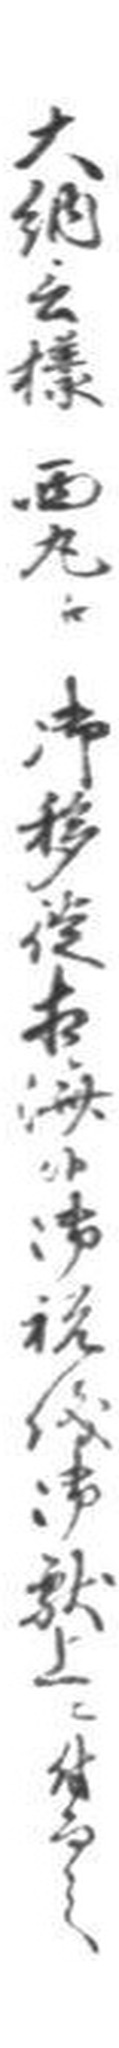大納言様西丸江御移徙相済候御祝儀御献上ニ付而之
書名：家譜 三十九 宗矩公 享保十年
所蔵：福井県文書館 Fukui Prefectural Archives
